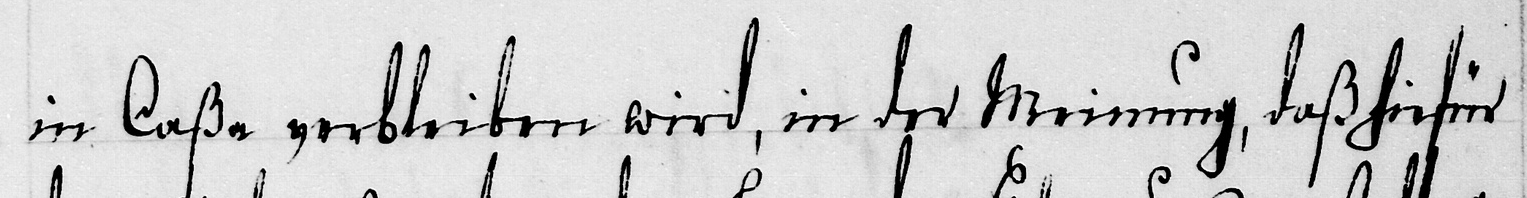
in Caßa verbleiben wird, in der Meinung, daß hiefür
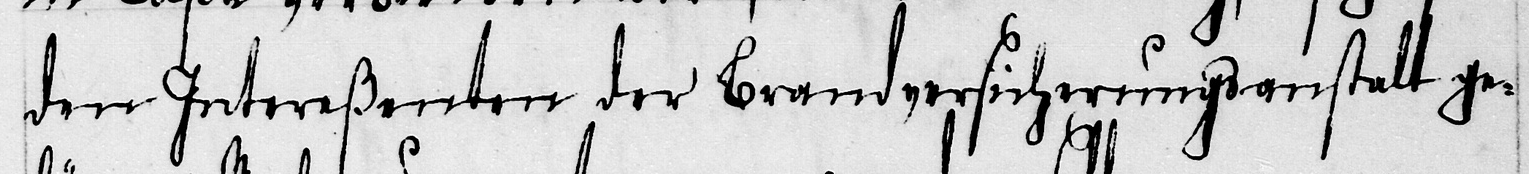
den Intereßenten der Brandversicherungsanstalt ge¬
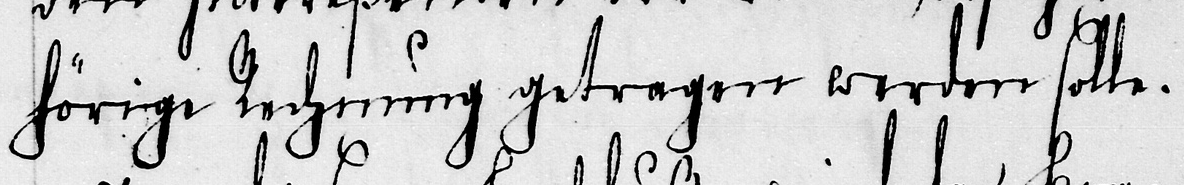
hörige Rechnung getragen werden solle.
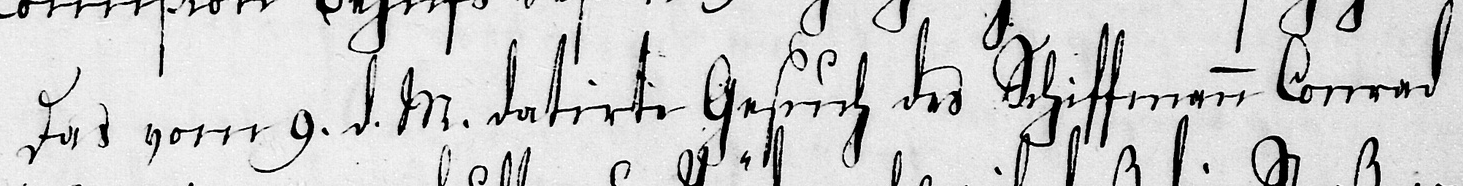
Das vom 9. d. M. datirte Gesuch des Schiffmann Conrad
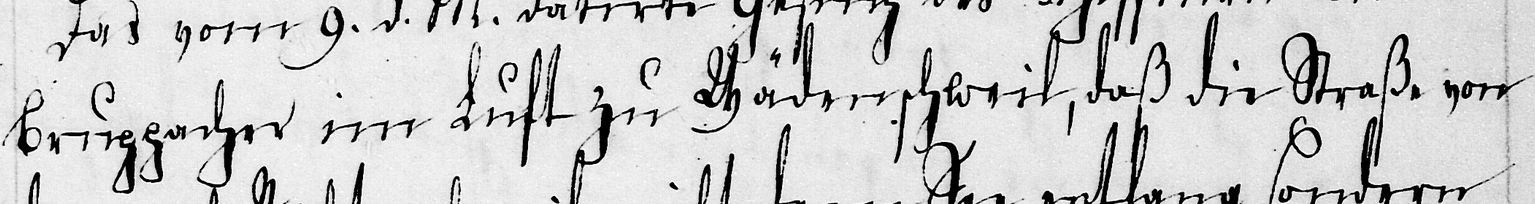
Bruppacher im Luft zu Wädenschweil, daß die Straße von
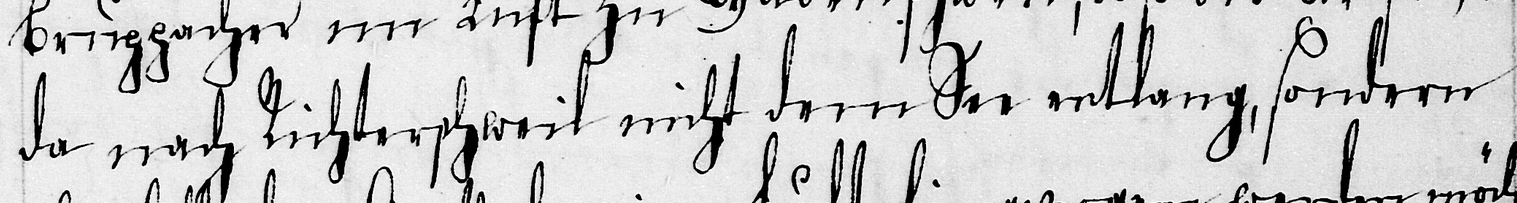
da nach Richterschweil nicht dem See entlang, sondern
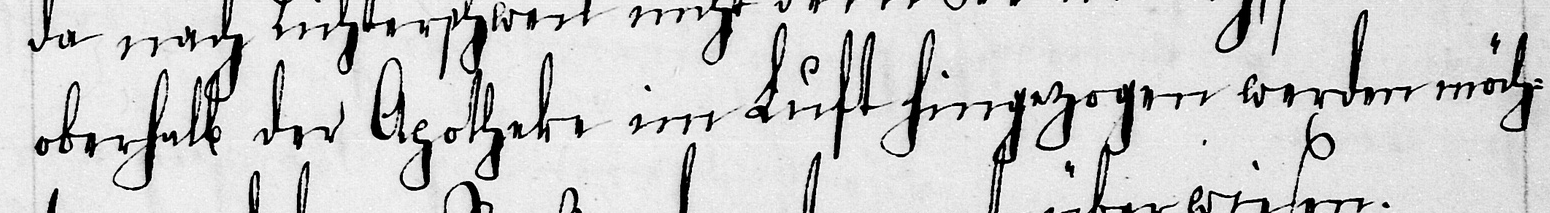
oberhalb der Apotheke im Luft hingezogen werden möch¬
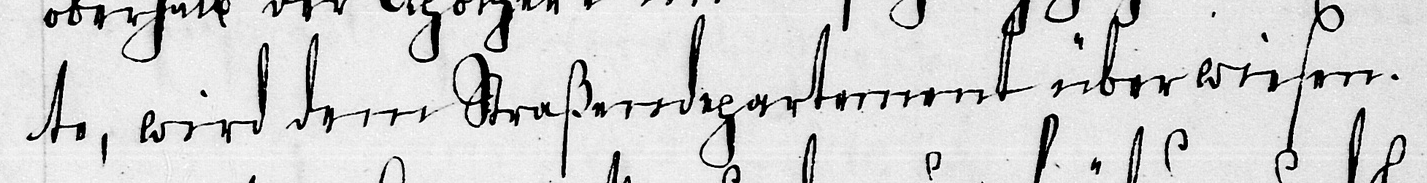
te, wird dem Straßendepartement überwiesen.
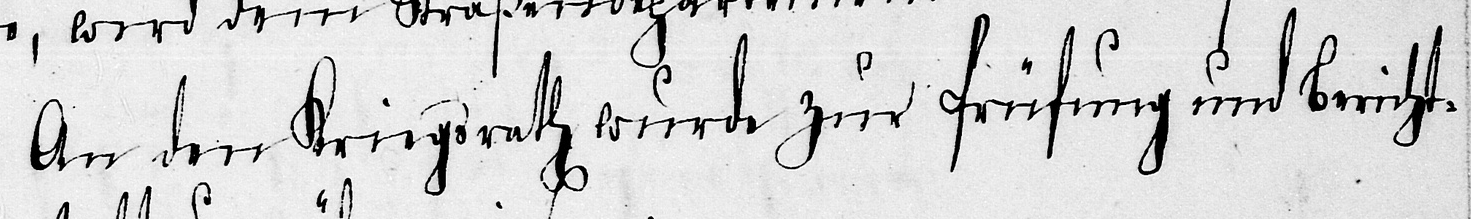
An den Kriegsrath wurde zur Prüfung und Bericht¬
